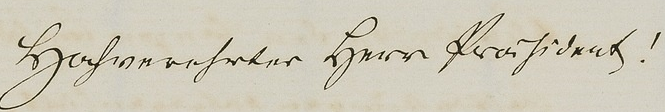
Hochverehrter Herr Präsident!
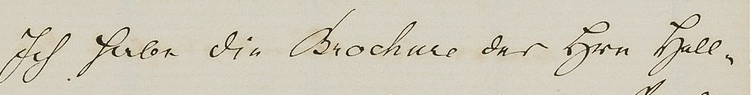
Ich habe die Brochure des Hrn. Hell-
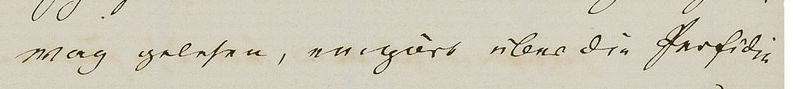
wag gelesen, empört über die Perfidie
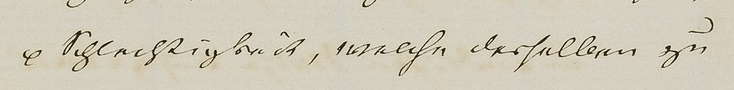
& Schlechtigkeit, welche derselben zu
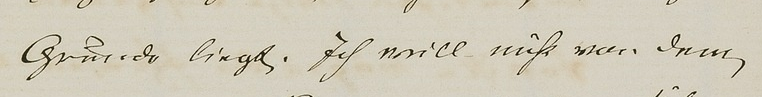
Grunde liegt. Ich will nicht von dem
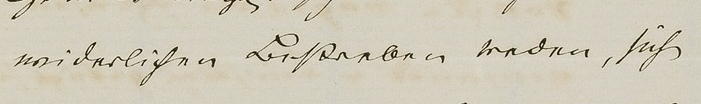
widerlichen Bestreben reden, sich
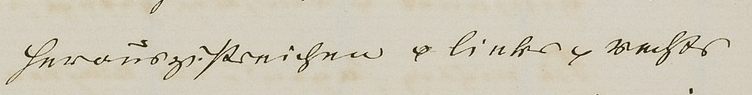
herauszustreichen & links & rechts
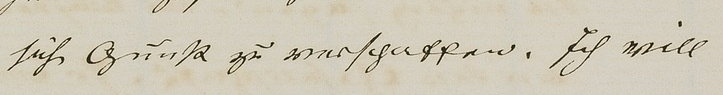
sich Gunst zu verschaffen. Ich will
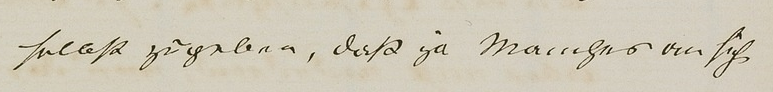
selbst zugeben, daß ja Manches an sich
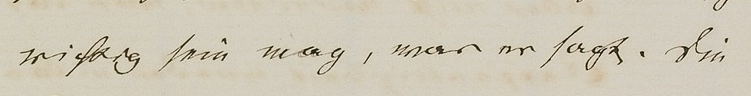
richtig sein mag, was er sagt. Die
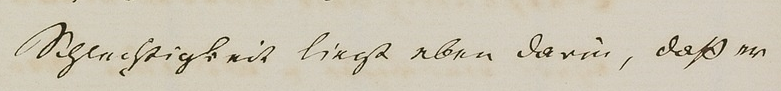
Schlechtigkeit liegt eben darin, daß er
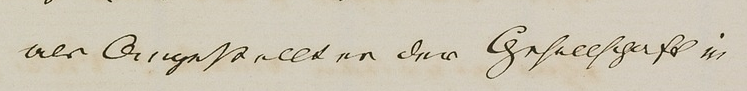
als Angestellter der Gesellschaft in
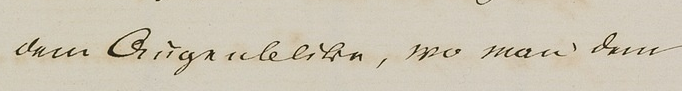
dem Augenblike, wo man dem
